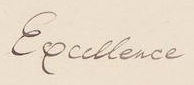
Excellence
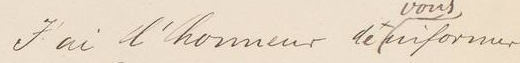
J'ai l'honneur de vous informer
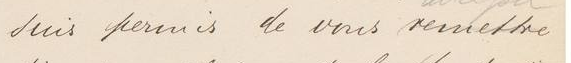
suis permis de vous remettre
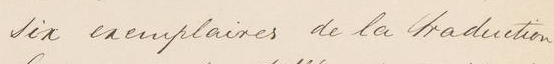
six exemplaires de la traduction
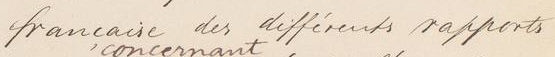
française des différents rapports
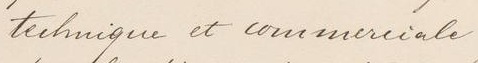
technique et commerciale
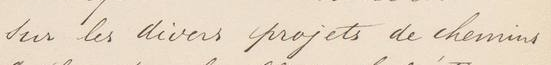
sur les divers projets de chemins
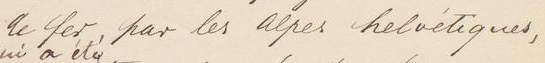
de fer par les Alpes helvétiques,
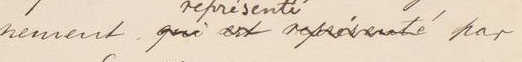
nement quiestreprésentéreprésenté par
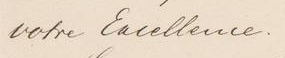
votre Excellence.
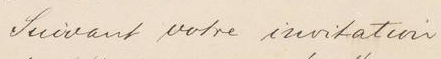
Suivant votre invitation
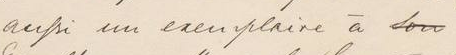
aussi un exemplaire à son
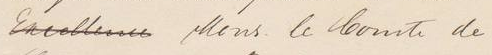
Excellence Mons. le Comte de
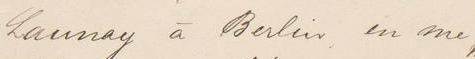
Launay à Berlin, en me
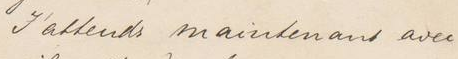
J'attends maintenant avec
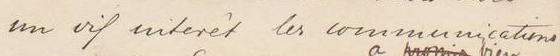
un vif interêt les communications
